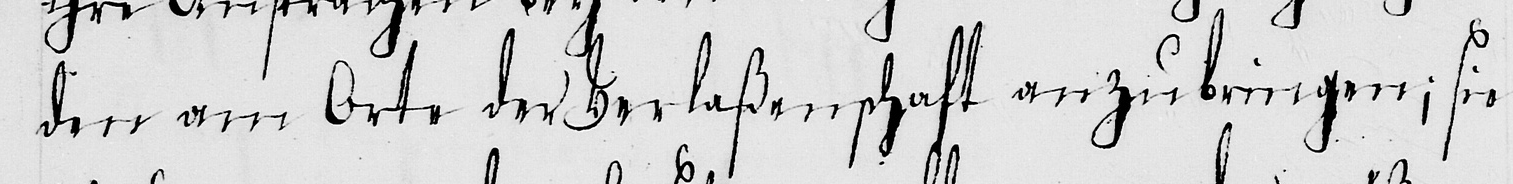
den am Orte der Verlaßenschaft anzubringen; sie
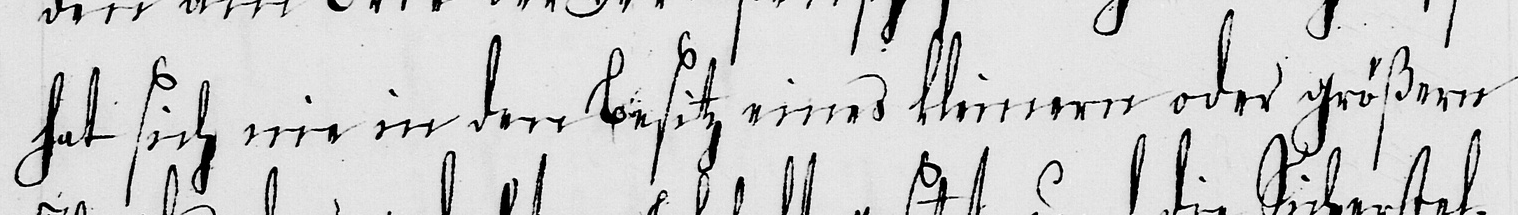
hat sich nie in den Besitz eines kleinern oder größern
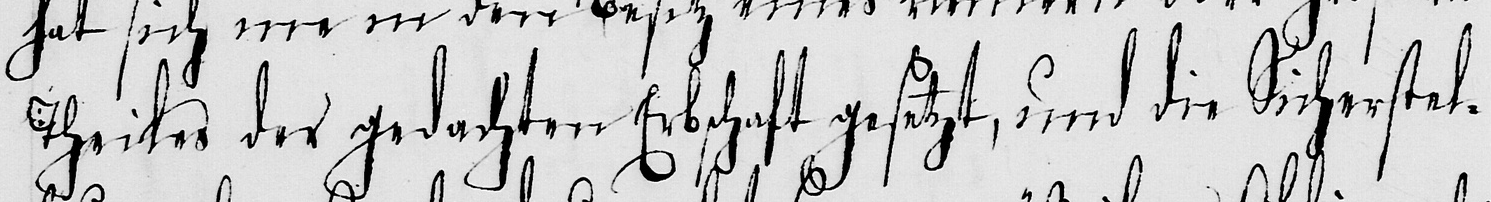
Theiles der gedachten Erbschaft gesetzt, und die Sicherste¬
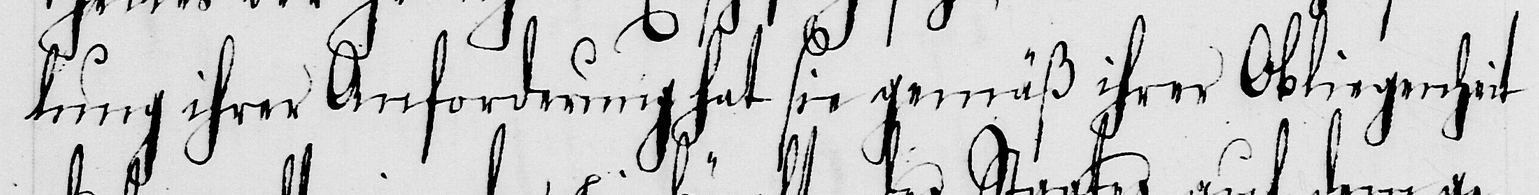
lung ihrer Anforderung hat sie gemäß ihrer Obliegenheit
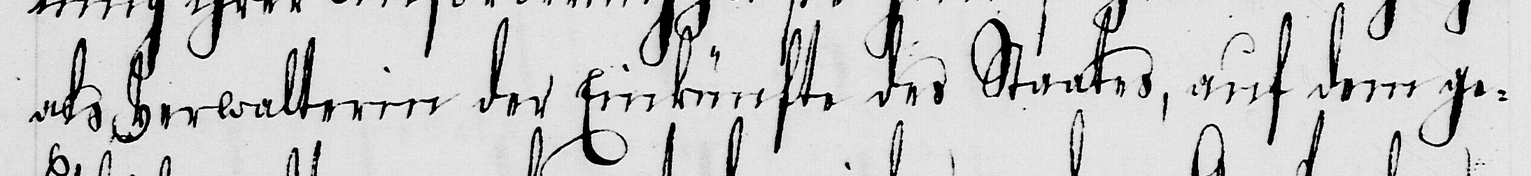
als Verwalterin der Einkünfte des Staates, auf dem ge¬
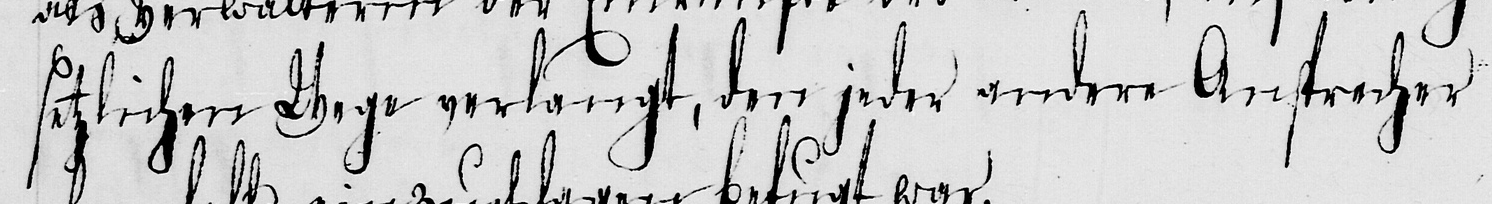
setzlichen Wege verlangt, den jeder andere Ansprecher
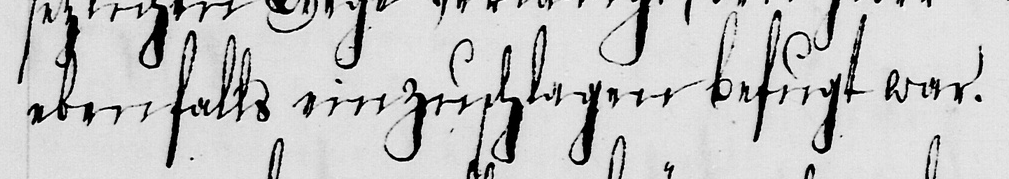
ebenfalls einzuschlagen befugt war.
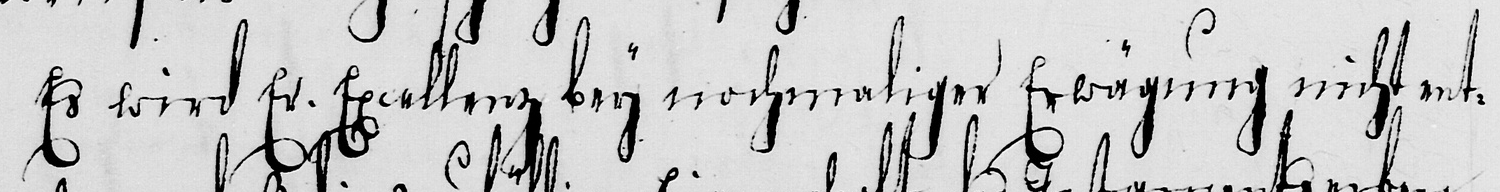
Es wird Er. Excellenz bey nochmaliger Erwägung nicht ent¬
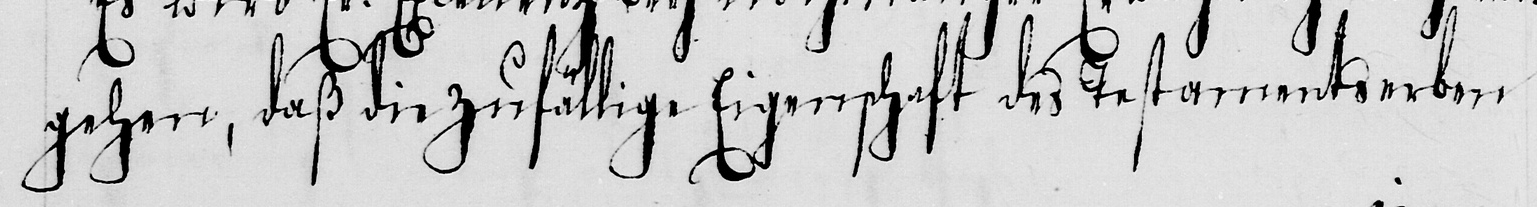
gehen, daß die zufällige Eigenschaft des Testamentserben
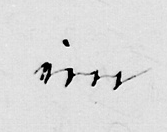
en
